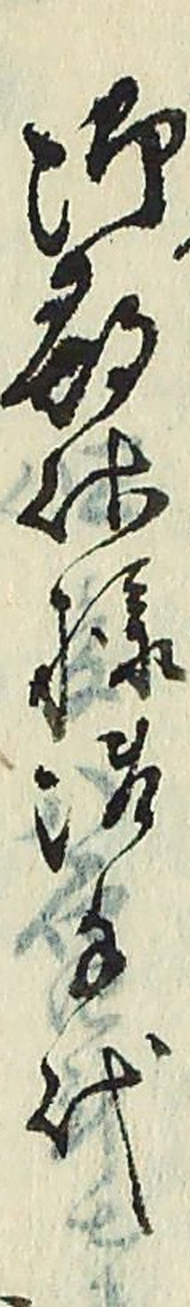御郡代様御手代
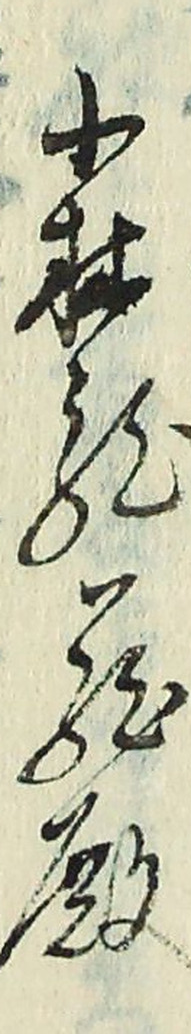小林龍蔵殿
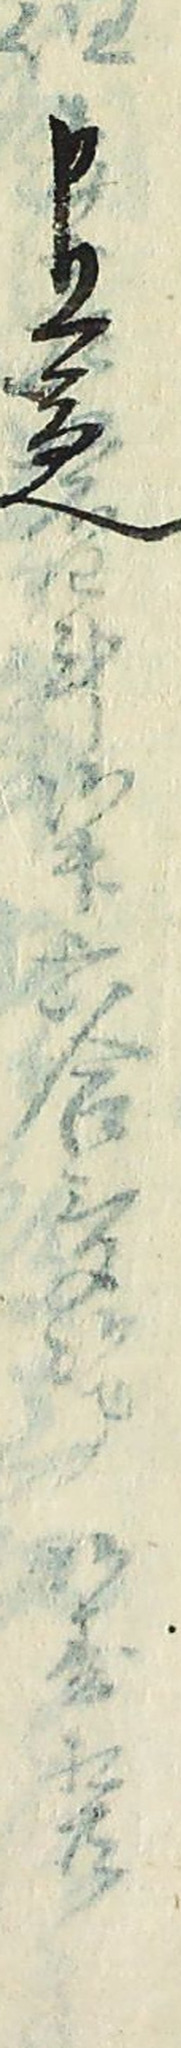申上覚
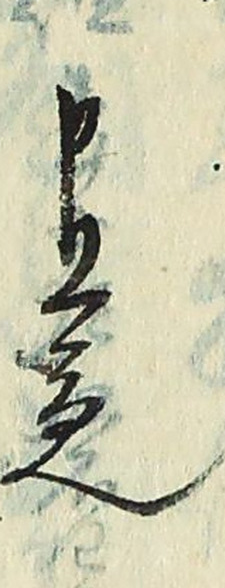申上覚
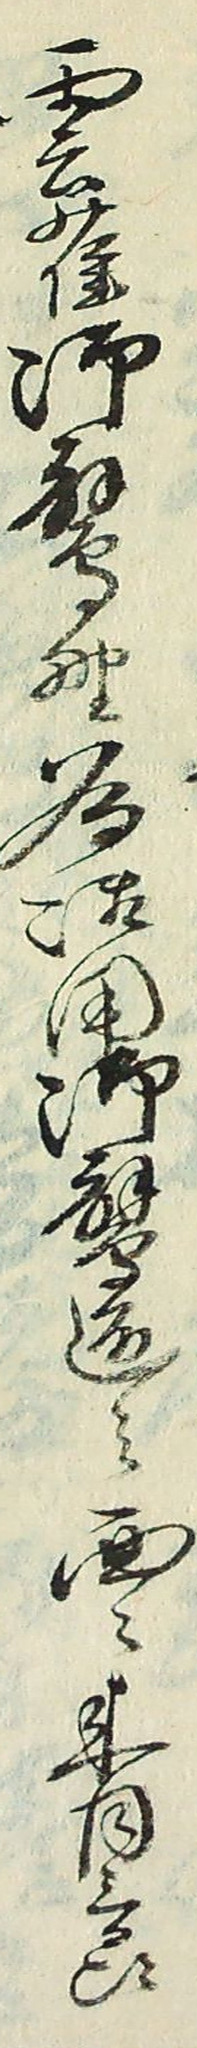雲雀御鷹野為御用御鷹匠之面々来月三日頃
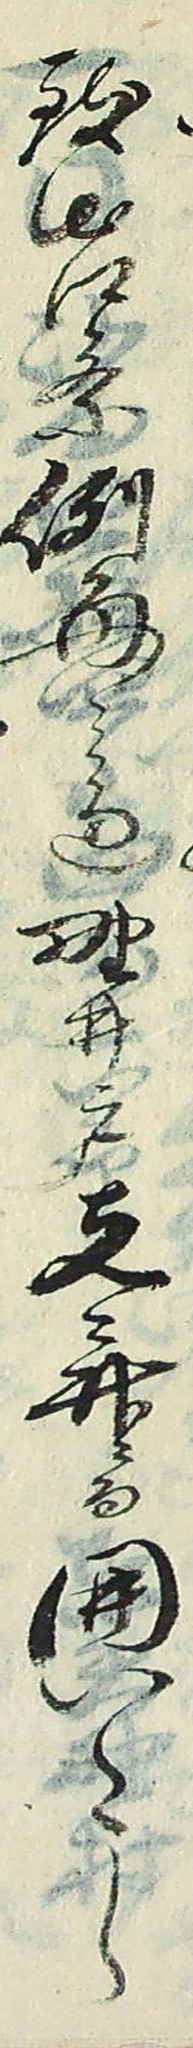致出郷候条例毎之通野井戸夫々竹に而囲いたし
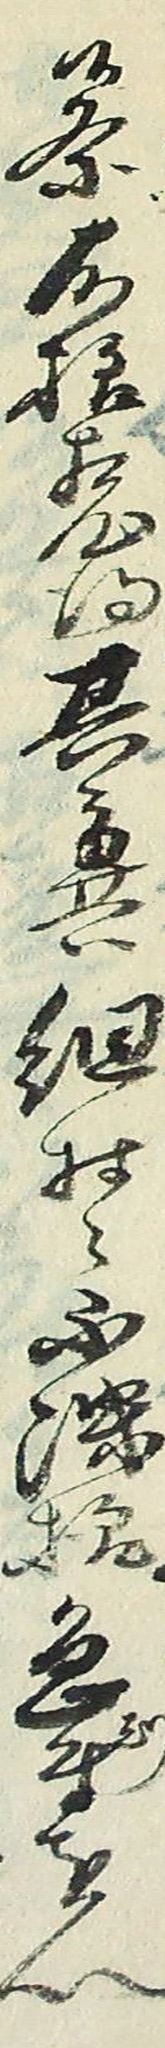候条左様相心得其方共組村々不洩様急刻付を以
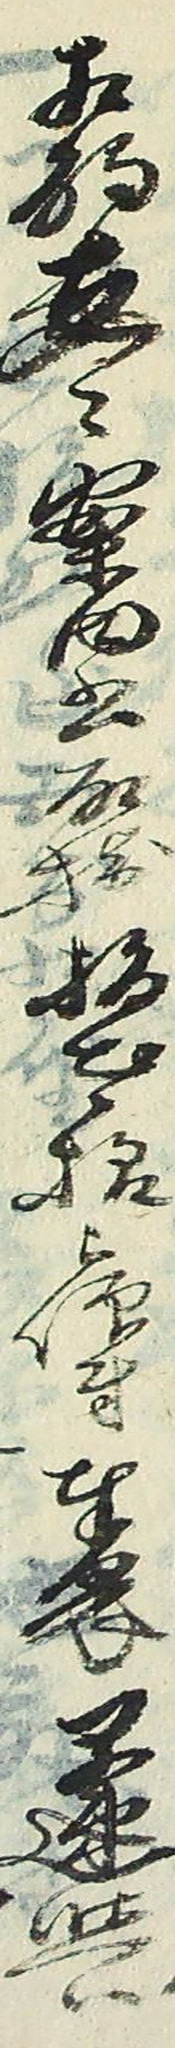相触夫々案内書取揃指出候様被仰付奉畏早速与
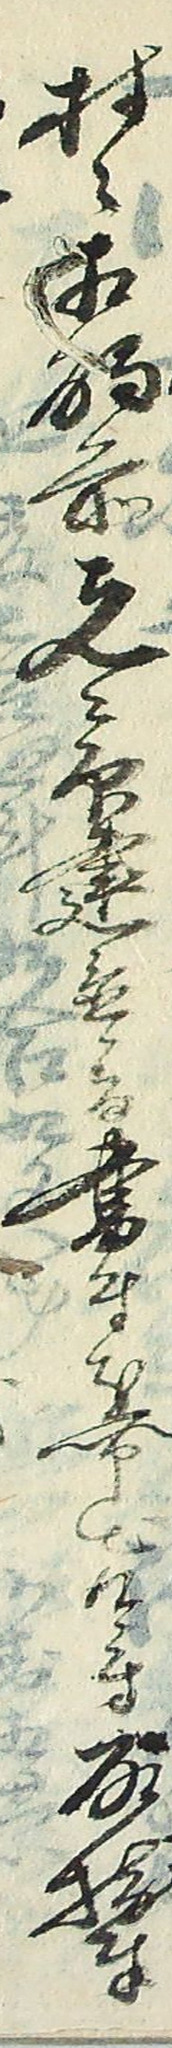村々相触候所夫々印建置候旨書付を以申出候に付取揃奉
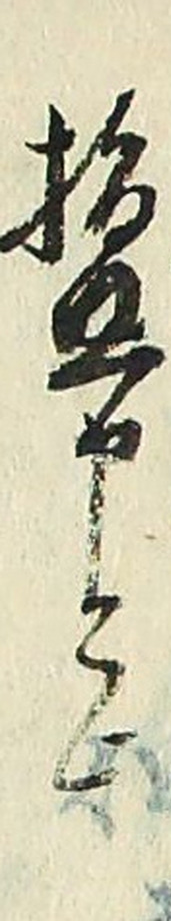指上申候以上
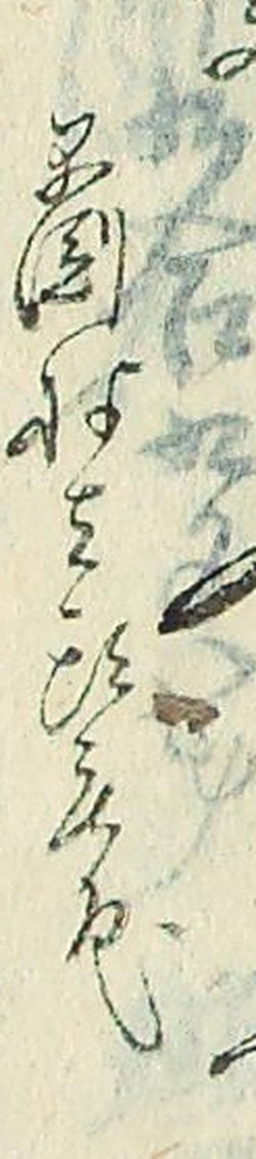早淵村与頭庄屋
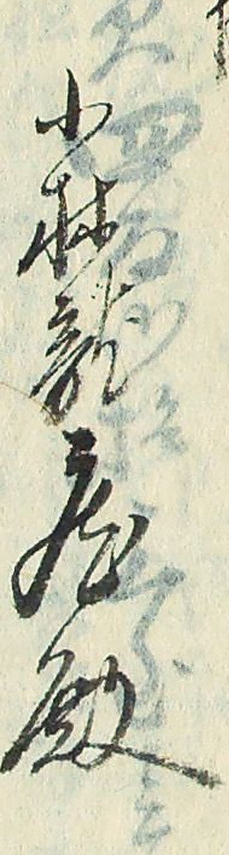小林龍蔵殿

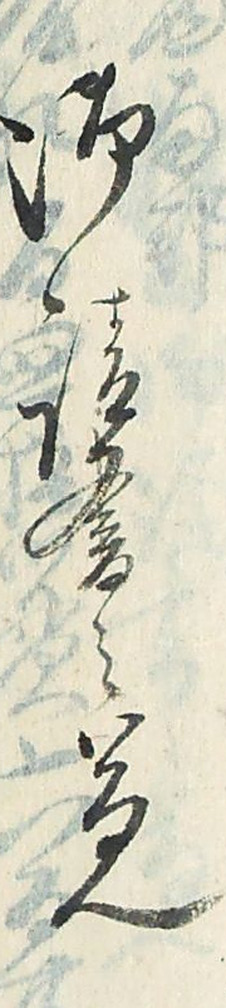御請書之覚
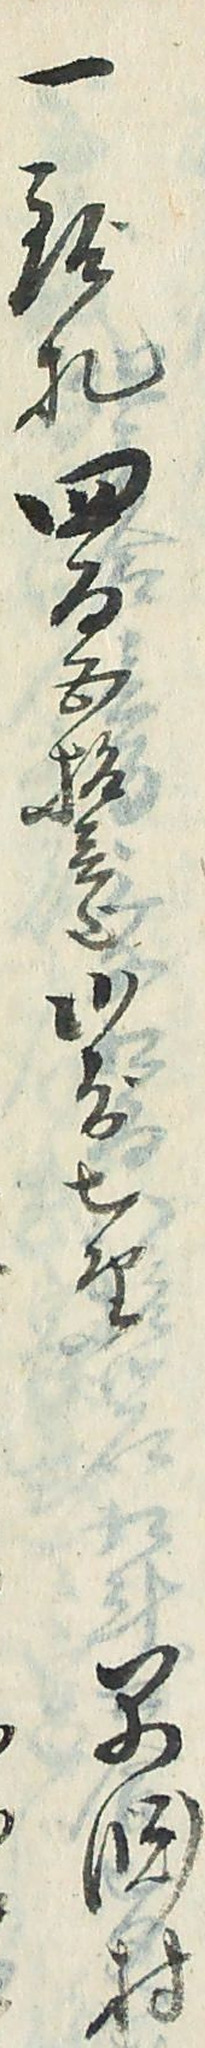一銀札四百五拾壱匁弐歩七厘早淵村
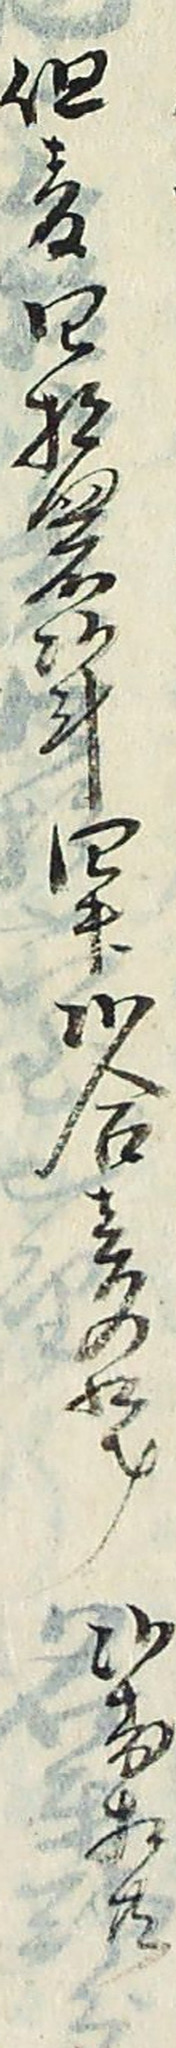但麦四拾四石弐斗四升弐合壱夕九才弐歩相共
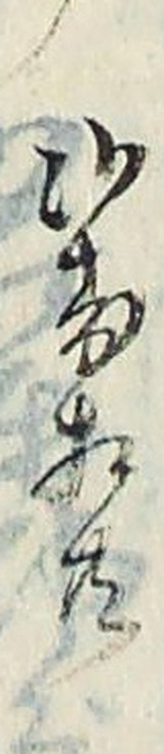弐歩相共
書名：諸御用御□受書控
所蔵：鳴門教育大学 Naruto University of Education
